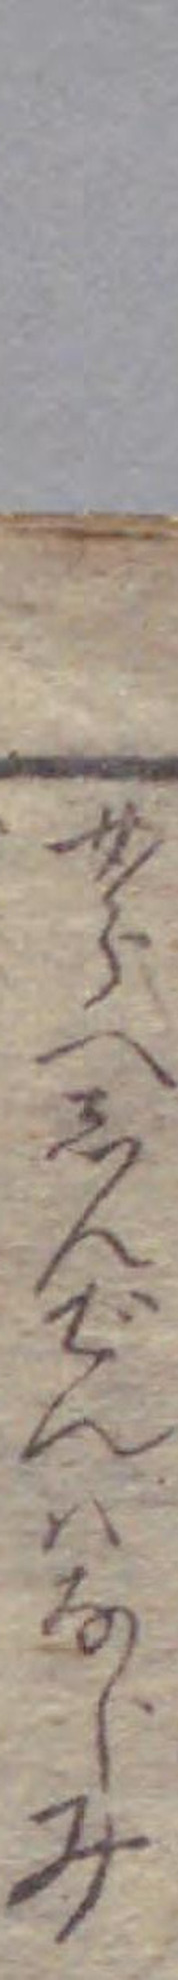女らへしんでんはなじみ
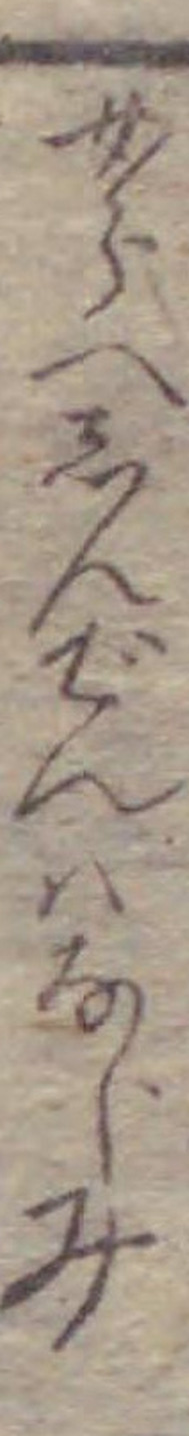女らへしんでんはなじみ
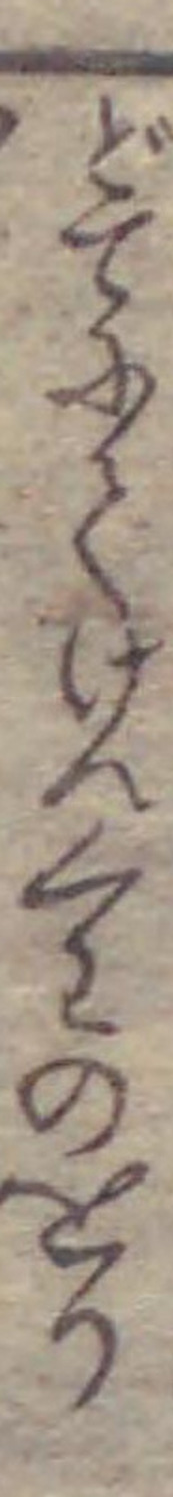どてにてけんくわのをり
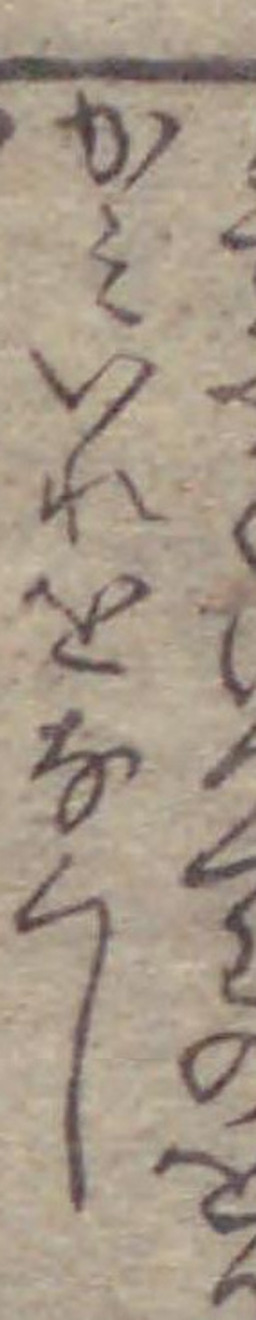かみいれをかくし
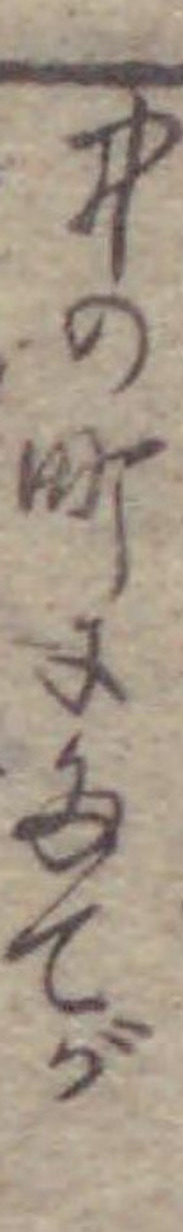中の町にたてが
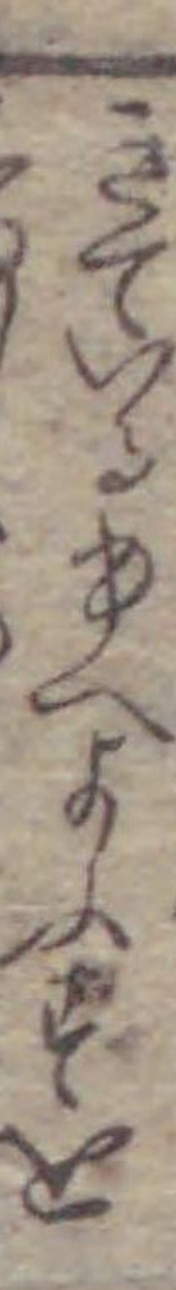きているゆへよふすを
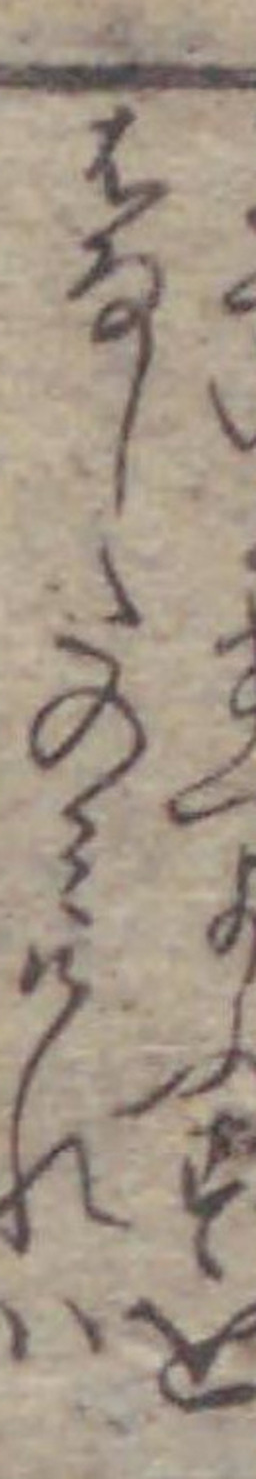はなしたのみけれは
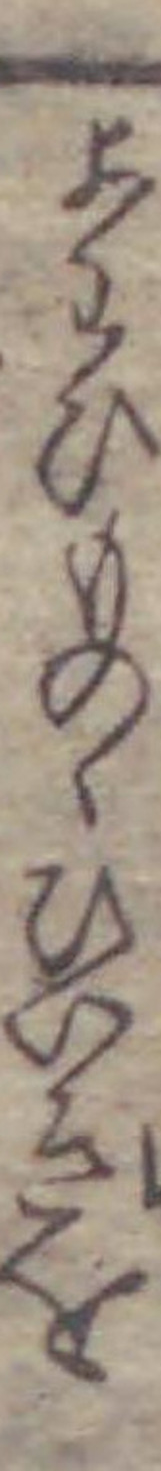よわひものゝひいきを
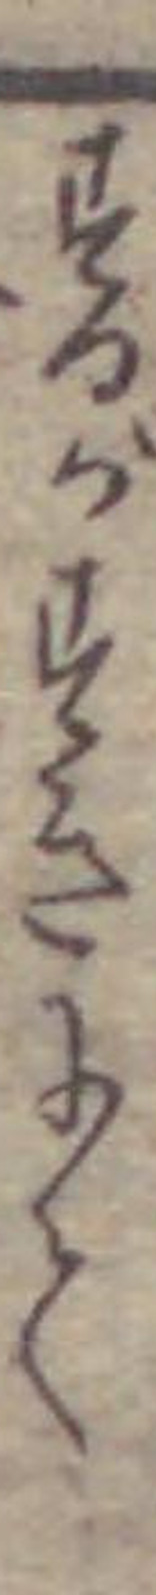するがすきにて
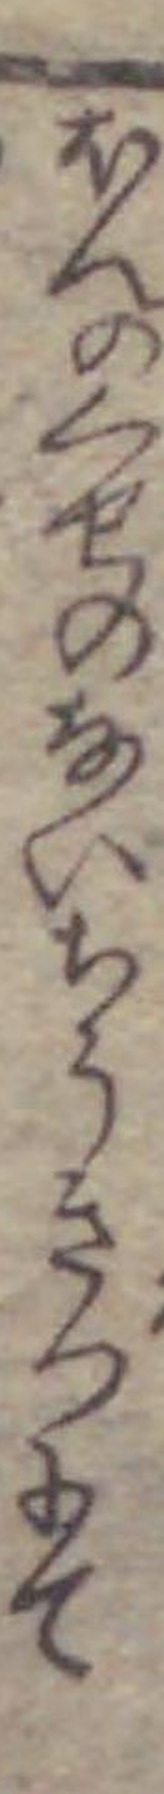しんのくせのないちうきつにて
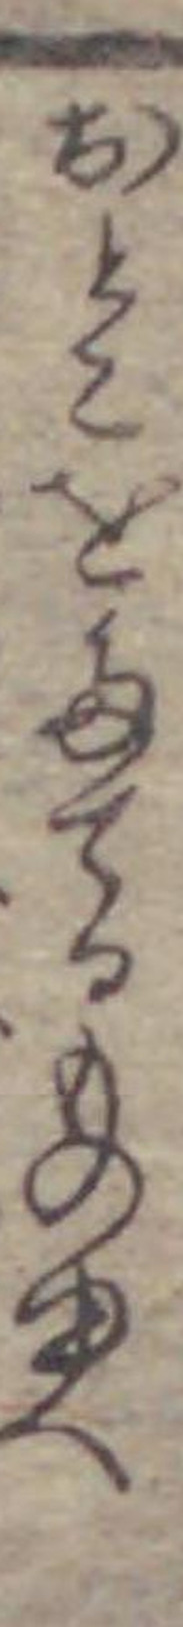おとこをたてるものゆへ
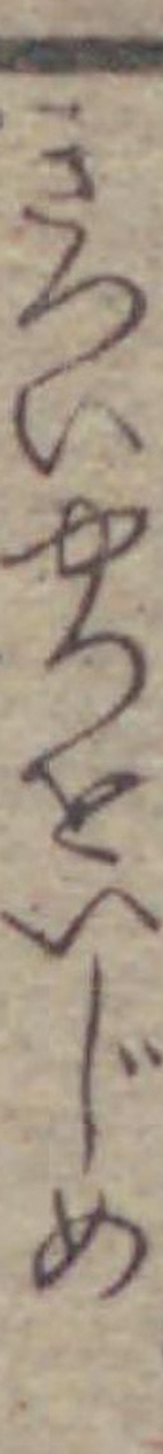きついやつをいじめ
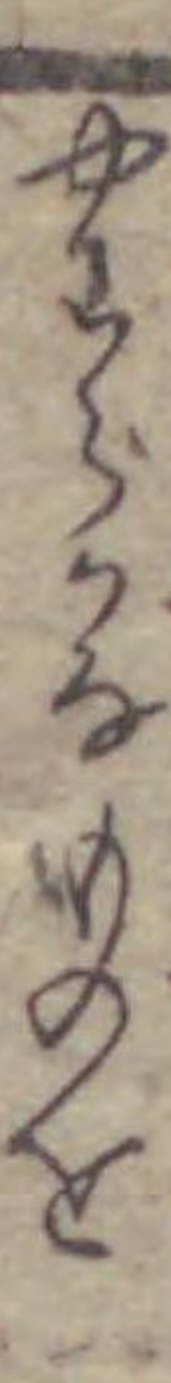やわらかなものを
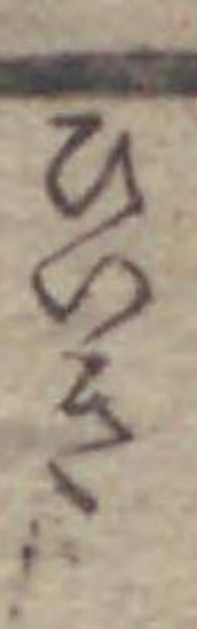ひいき
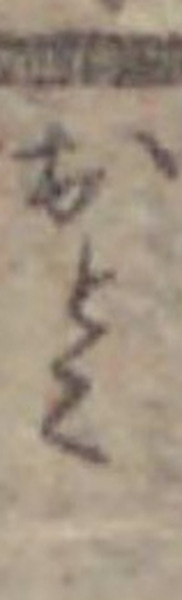おとこ
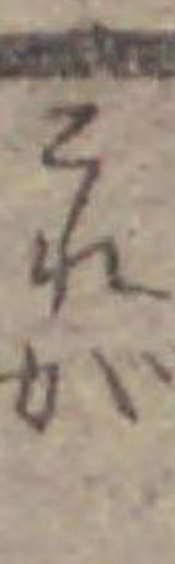これが
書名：談芭菰誉詞 : 3巻
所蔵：国立国会図書館 National Diet Library, JAPAN
